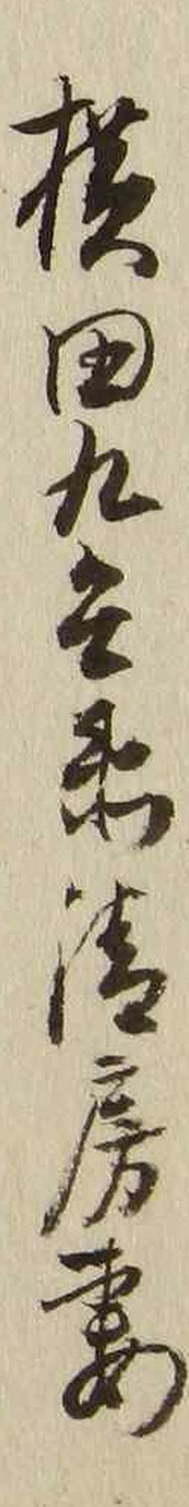女横田九兵衛清房妻
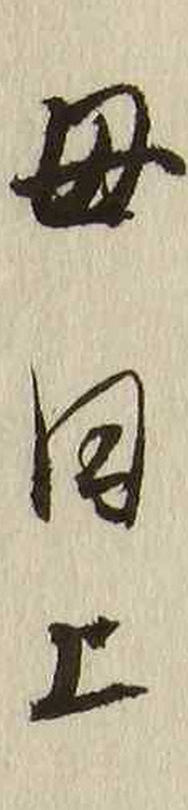母同上
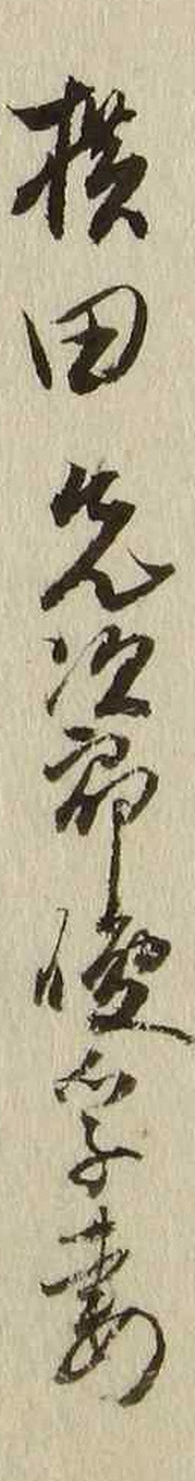女横田先次郎俊字妻
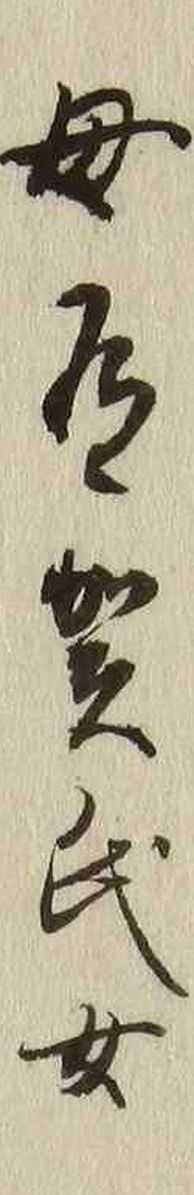母有賀氏女
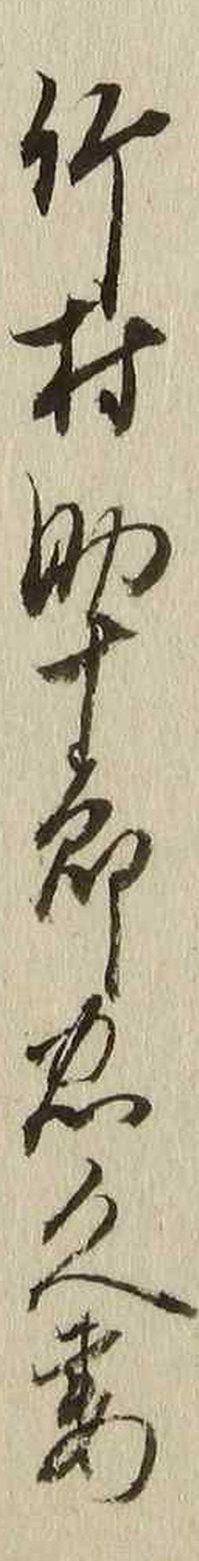女竹村助十郎忠久妻
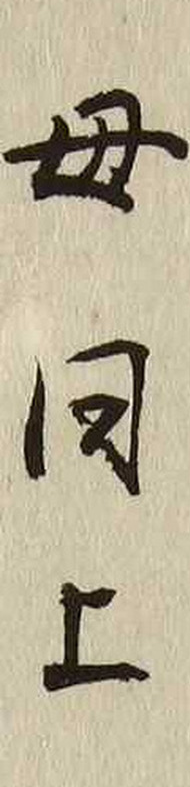母同上
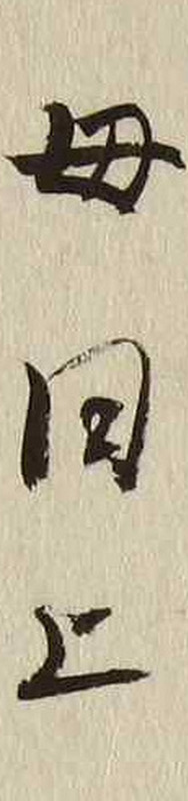母同上
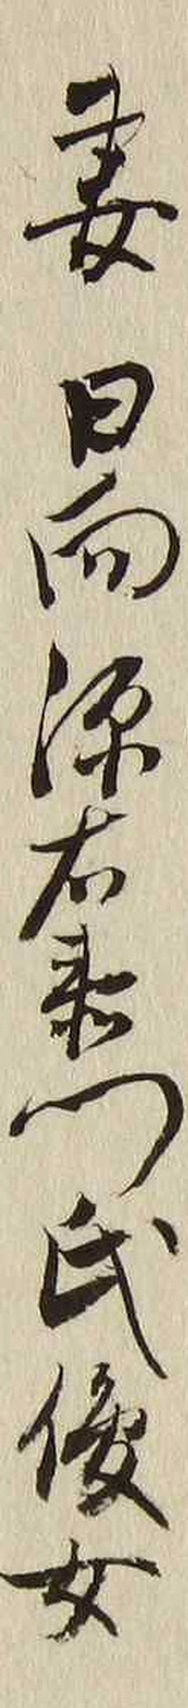妻日向源右衛門氏俊女
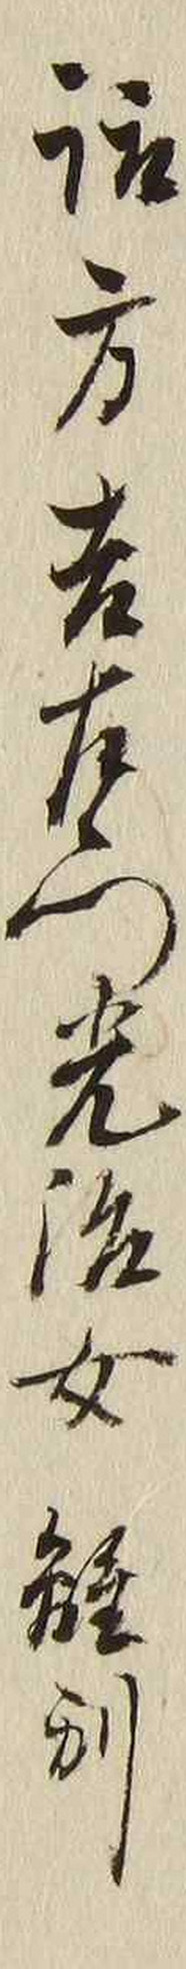諏方吉左衛門光治女離別

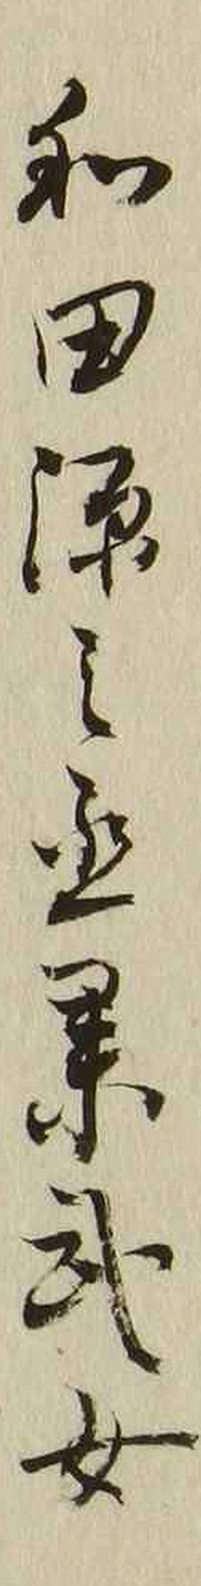和田源之丞業武女
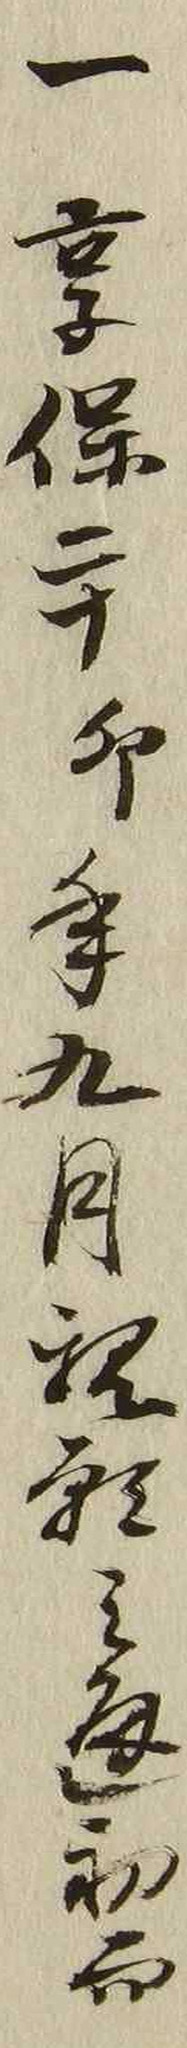一享保二十卯年九月親願之通初而
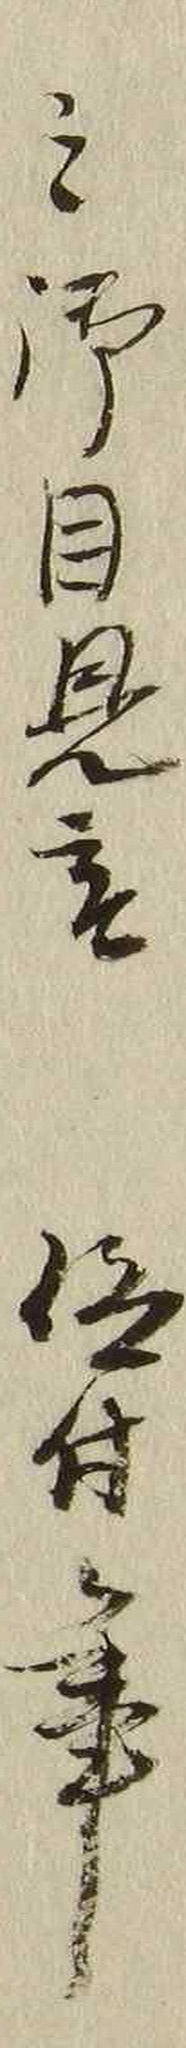之御目見被仰付候事
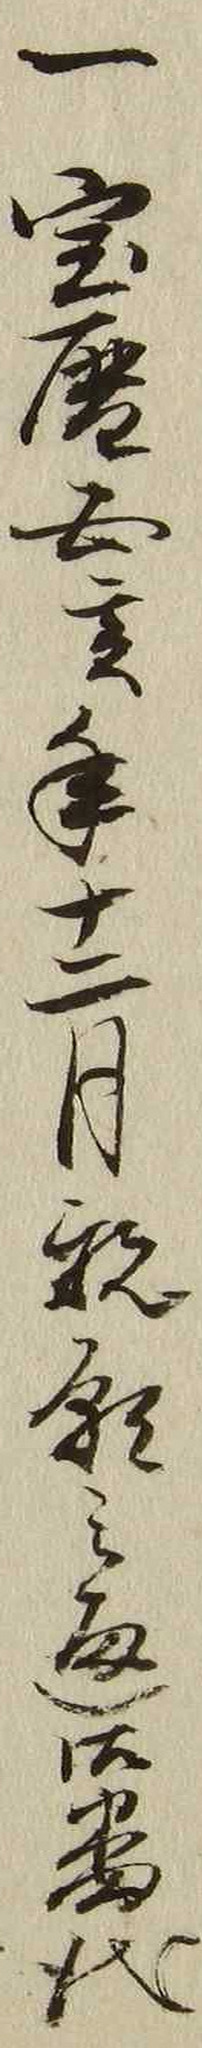一宝暦五亥年十二月親願之通御番代
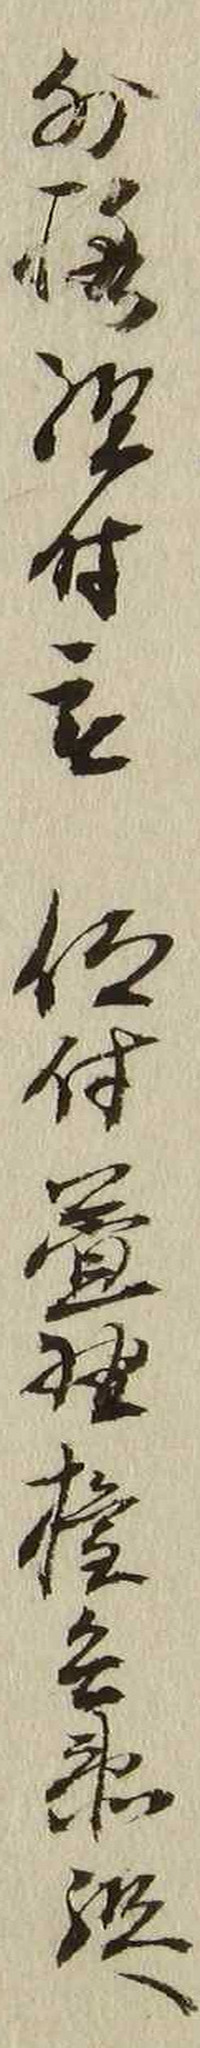外様組付被仰付益野権兵衛組へ
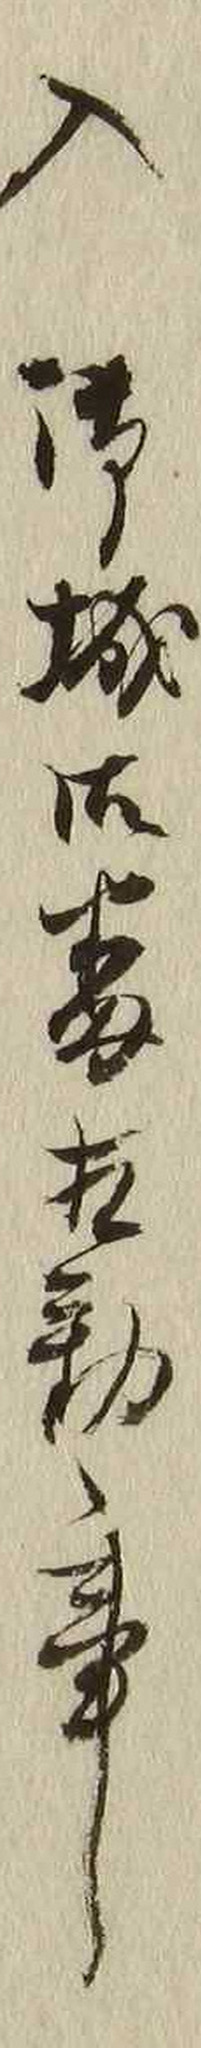入御城御番相勤候事
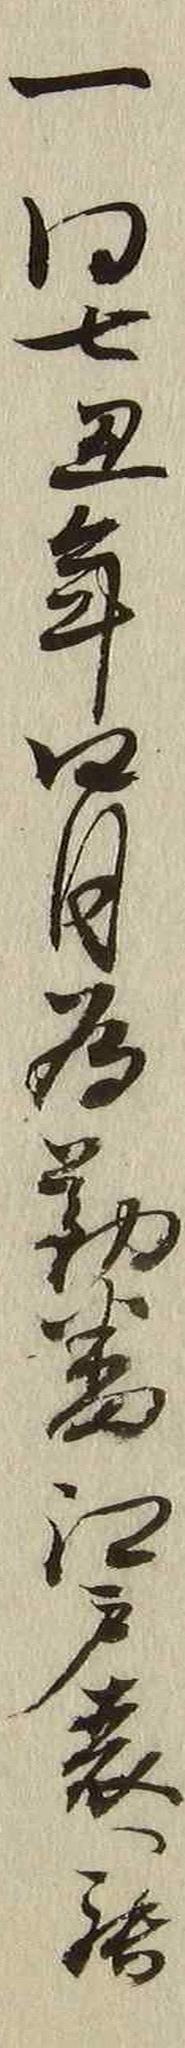一同七丑年四月為勤番江戸表へ罷
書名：諸士系譜　巻之348　も之部4
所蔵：会津若松市立会津図書館
